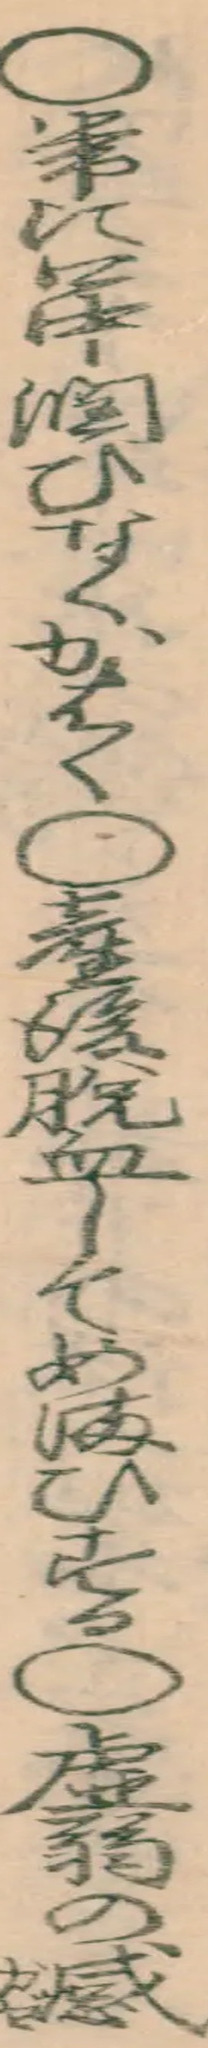○常に口中潤ひなくかはく○産後脱血してめまひする○虚弱の感
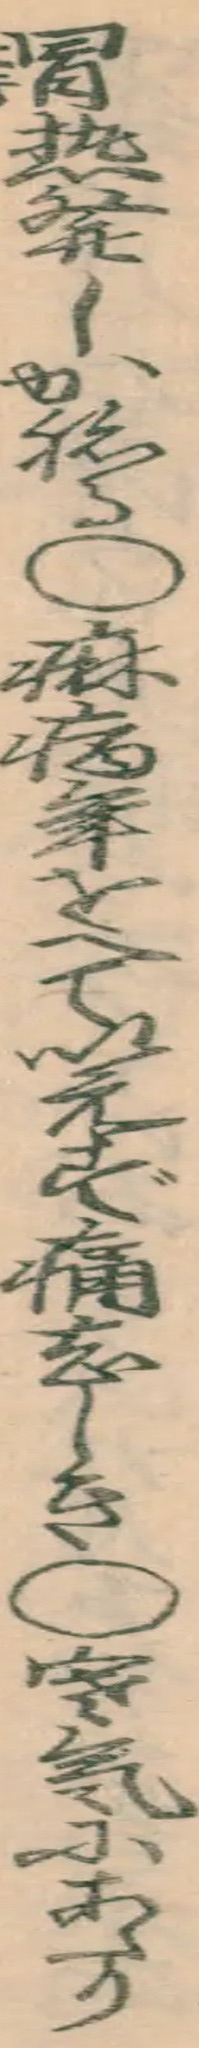冒熱発しかねる○痳病年をへていえず痛甚しき○寒気にあたり
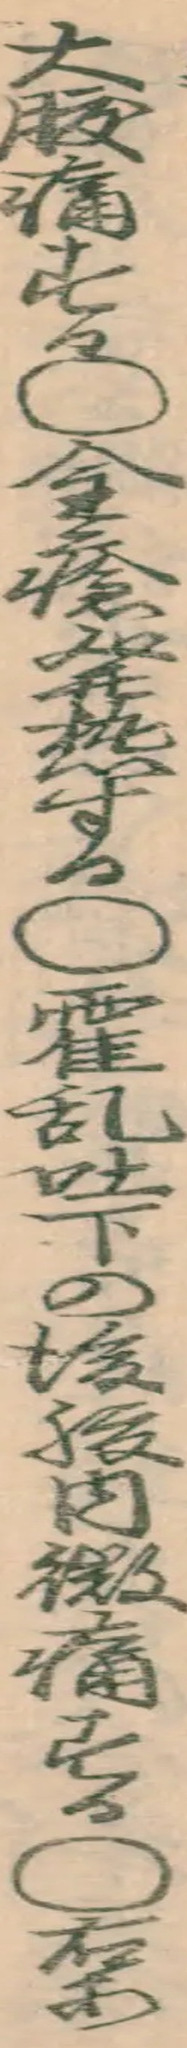大腹痛する○金瘡発熱する○霍乱吐下の後腹内微痛する○右あ
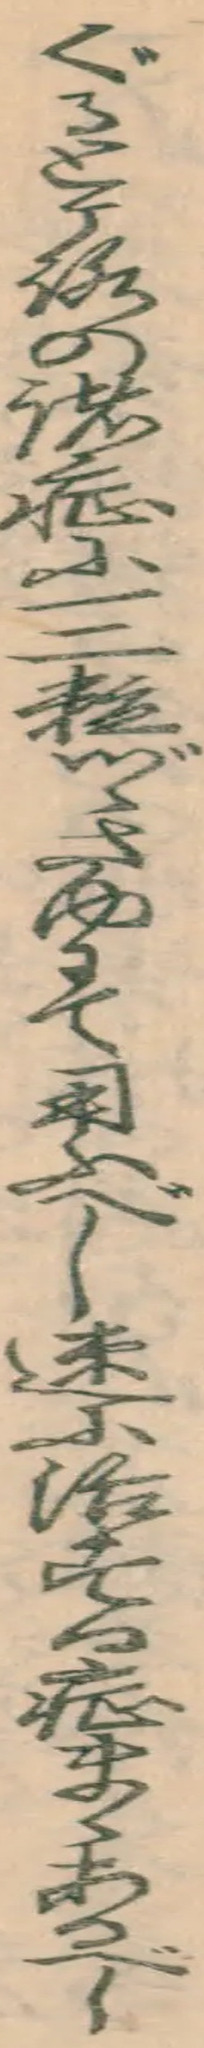ぐるところの諸症に三粒づゝさゆにて用ふべし速に治する症まゝあるべし
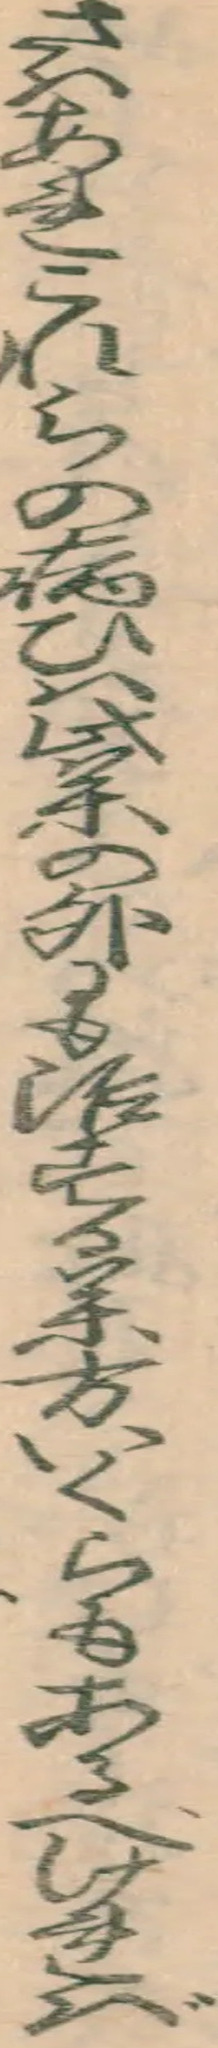さはあれこれらの病ひは此薬の外にも治する薬方いくらもあるへければ
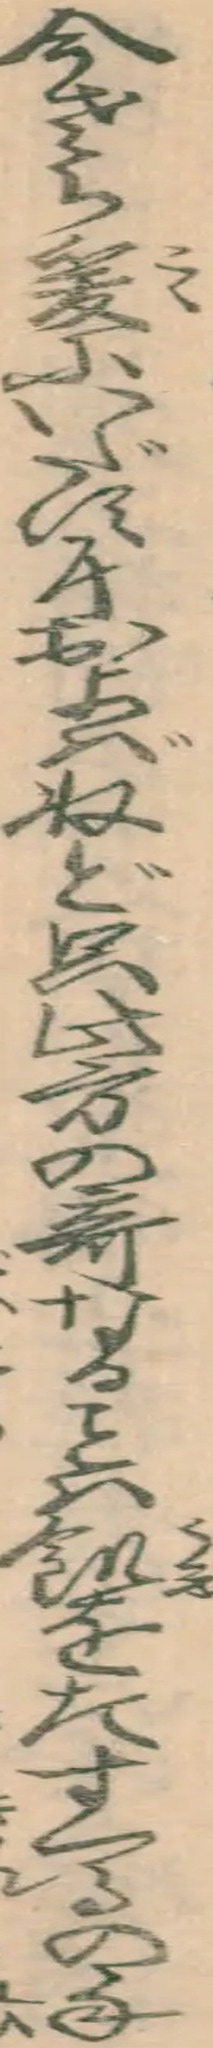今さら爰にいだすにおよばねど只此方の奇なることは飢をたすくるの手
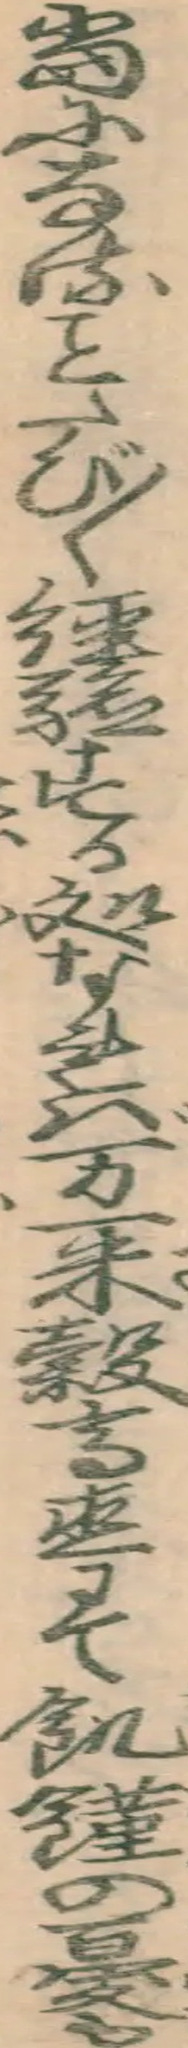当になることたび〳〵経験する処なれば万一米穀高直にて飢饉の憂も
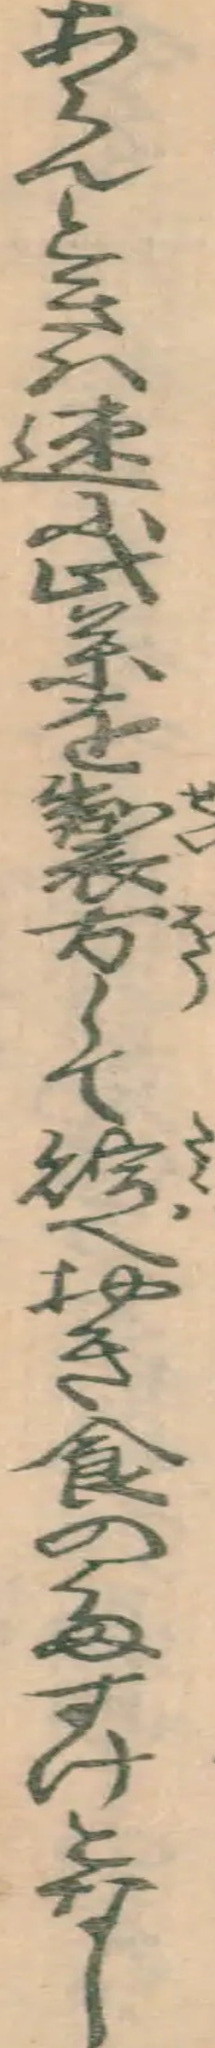あらんときは速に此薬を製方して貯へおき食のたすけとなし

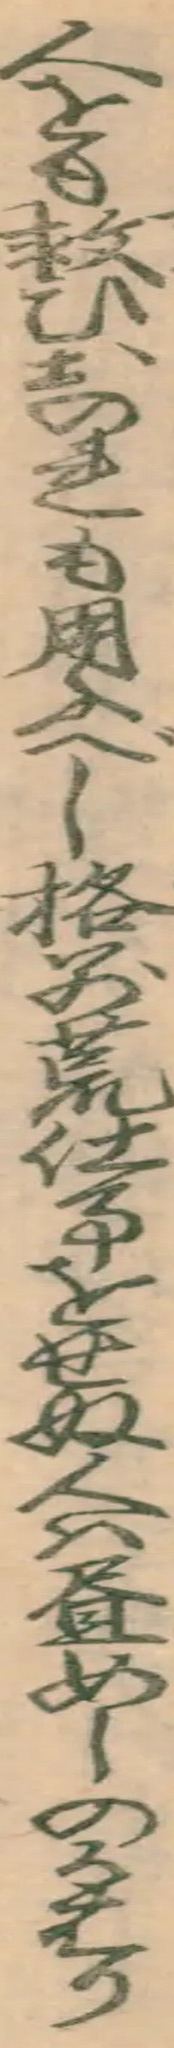人をも救ひおのれも用ふべし格別荒仕事をせぬ人は昼めしのかはり
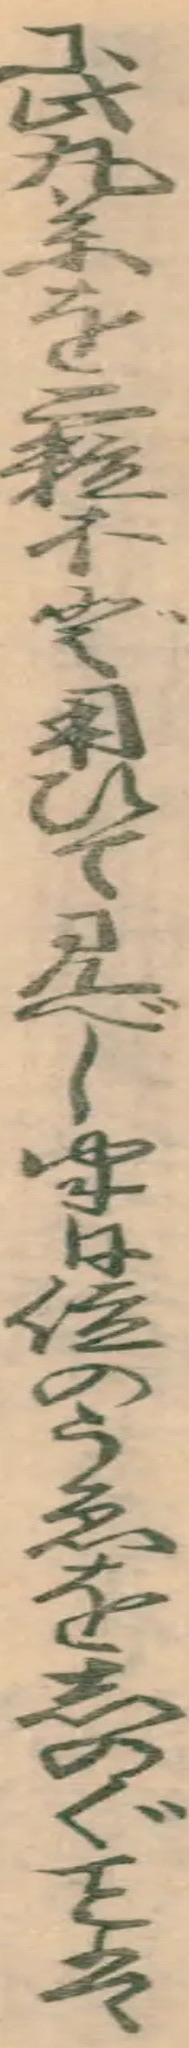に此丸薬を二粒ほど用ひて見べし半日位のうゑをしのぐことは
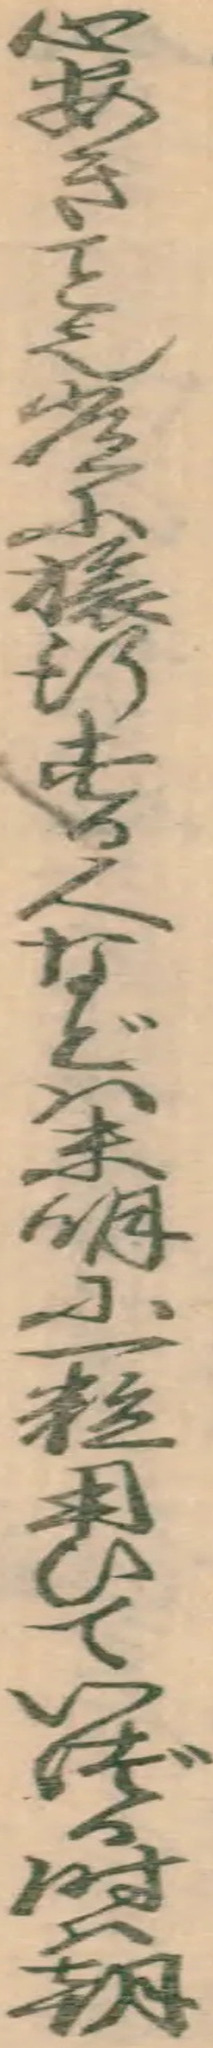心安きこと也常に旅行する人などは未明に一粒用ひていづる時は朝
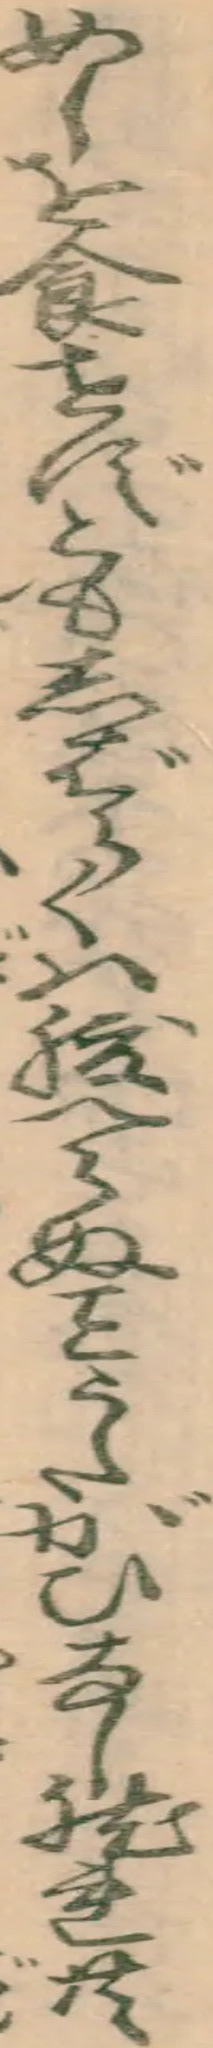めしを食せずともしばらくは腹へらぬことうたがひなし然れ共
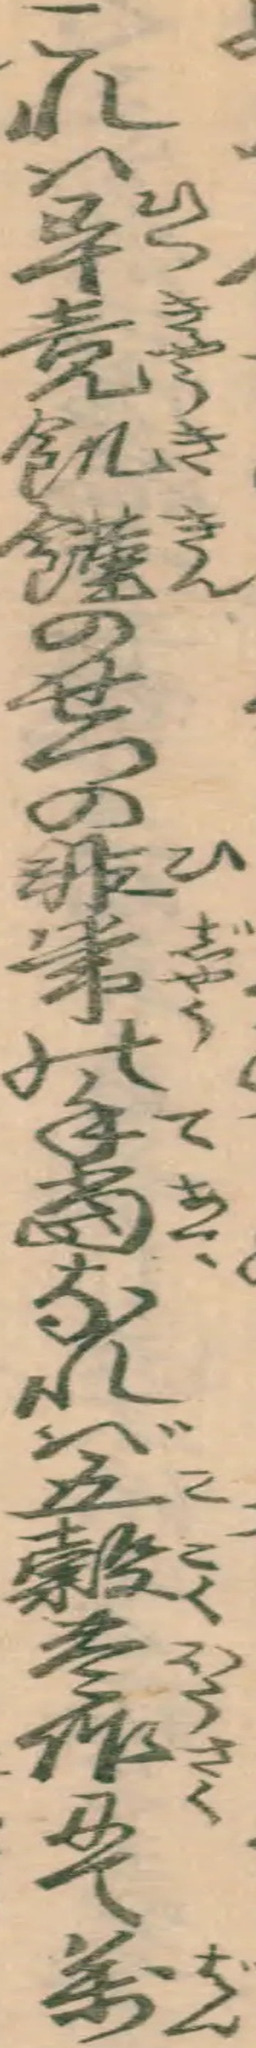これは畢竟飢饉のせつの非常の手当なれば五穀豊作にて万
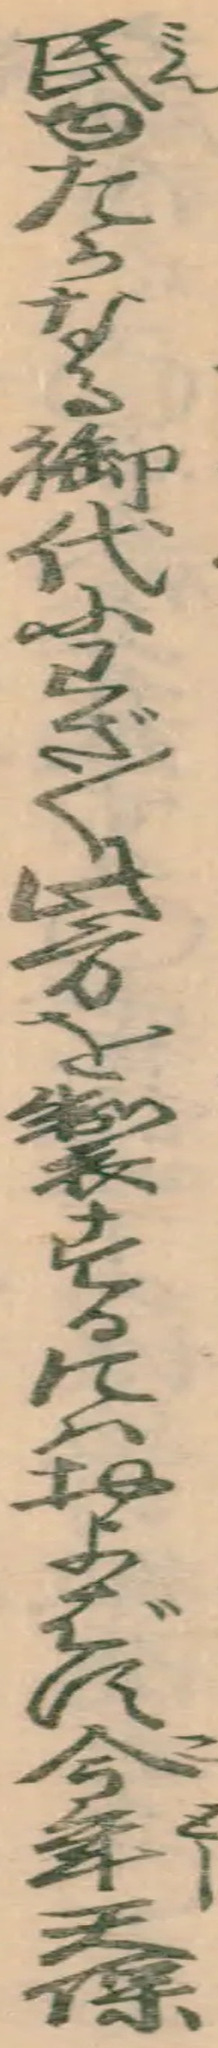民ゆたかなる御代にわざ〳〵此方を製するにはおよばす今年天保
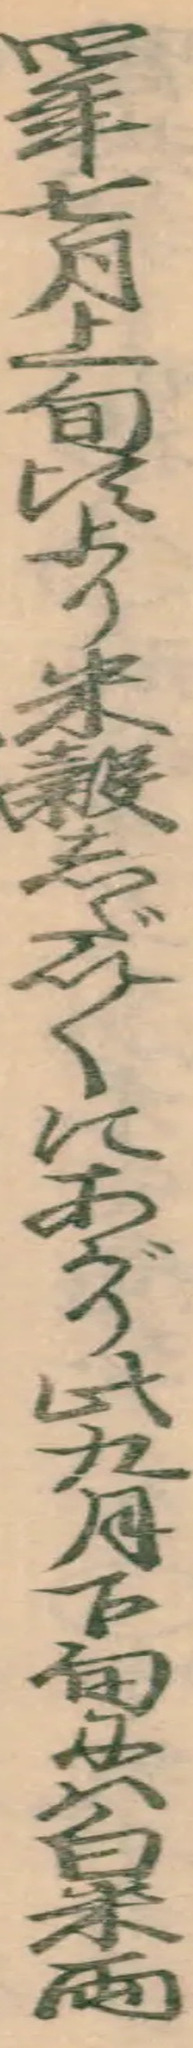四年七月上旬頃より米穀しだい〳〵にあがり此九月下旬には白米両
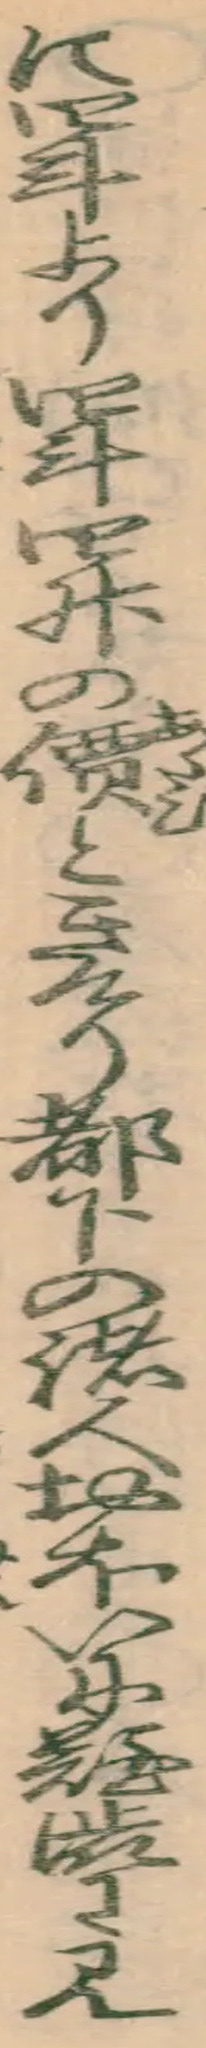に四斗より四斗四升の價ときけり都下の諸人おほいに難渋に見
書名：日ごとの心得
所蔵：国立国会図書館 National Diet Library, JAPAN
